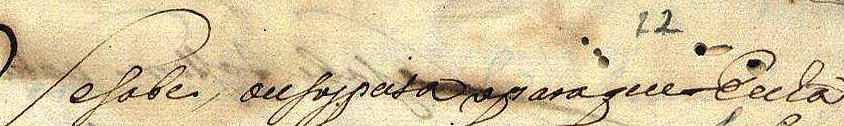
se sabe, ou sospeita o para que he cha
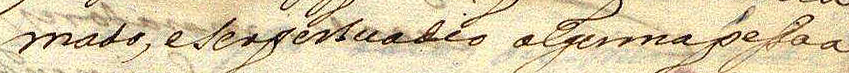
mado, e se o persuadio alguma pessoa
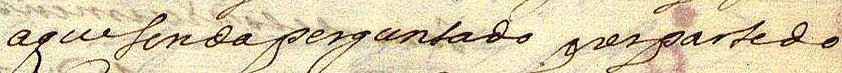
a que sendo perguntado por parte do
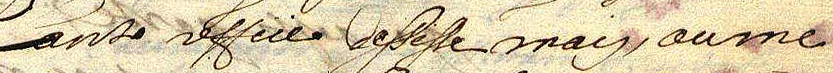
Santo officio dessesse mais, ou me
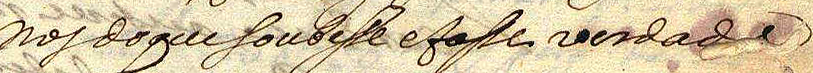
nos do que soubesse e fosse verdade
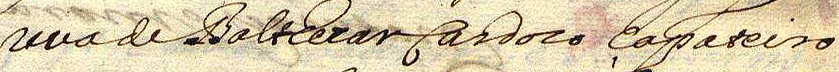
uva de Balthezar Cardozo çapateiro
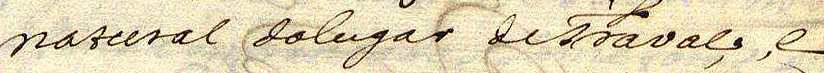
natural do lugar de Travaço, e
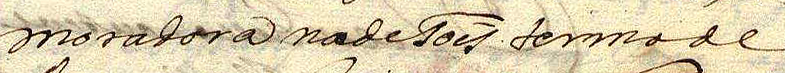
moradora no de Toẽs termo de
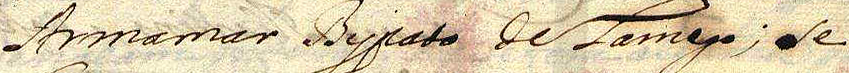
Armamar Bispado de Lamego; se
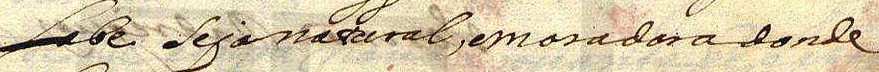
sabe seja natural, e moradora donde
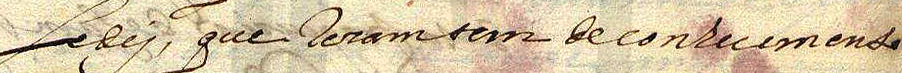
se dis, que Rezam tem de conhecimento
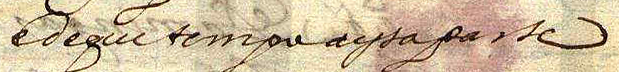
e de que tempo a esta parte
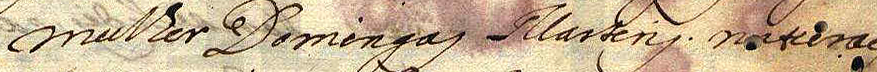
mulher Domingas Martins naturaes
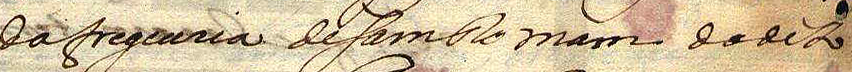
da freguezia de sam Romam do dito
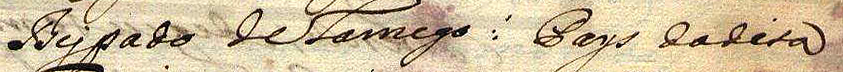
Bispado de Lamego: Pays da dita
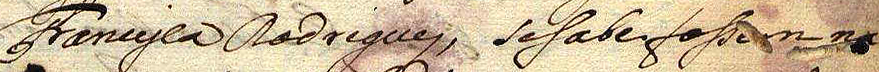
Francisca Rodrigues, se sabe foss_m na
